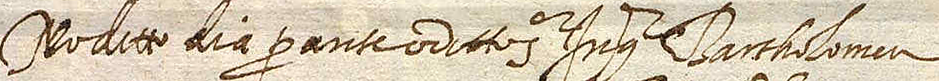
No ditto dia ꝓante o ditto sor Jnq̄r Bartholomeu
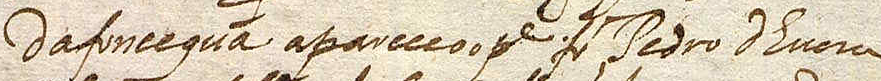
da foncequa apareceo o pe fr̄ Pedro dEuora
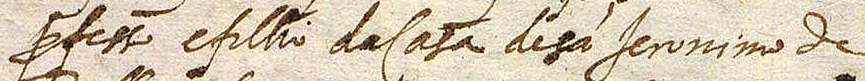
ꝓfesso e filho da Casa de sā Jeronimo de
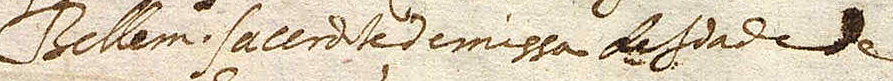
Bellem. sacerdote de missa de Jdade de
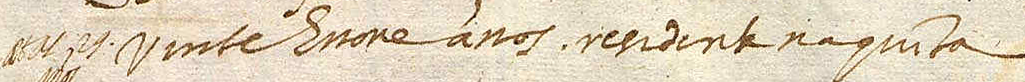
vinte E noue ānos. residente na quīta
